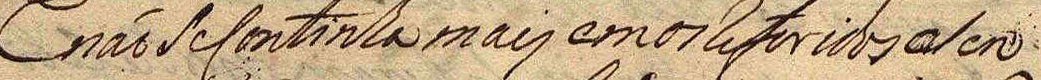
E não se Continha mais em os Referidos sen
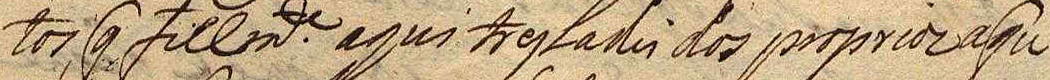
tos, q̄ fielm.te aqui tresLadei dos proprioz a qu
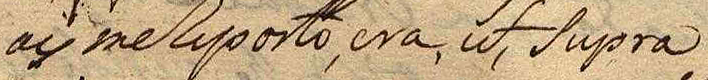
ais me Reporto, era, ut, supra
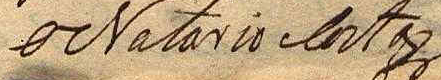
o Notario Costa
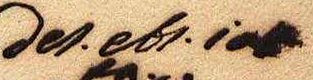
des. obs. ia_
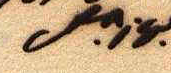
st.a i8.
